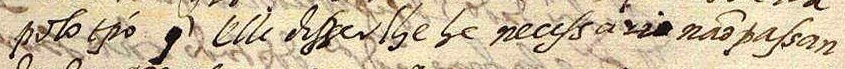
polo tpō q̄ elle disser lhe he necessario naõ passan
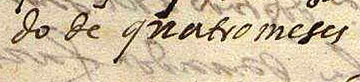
do de quatro meses.
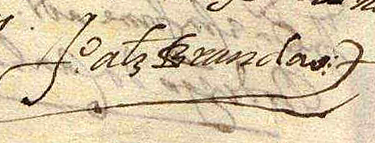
J.o al̄z Brandao
